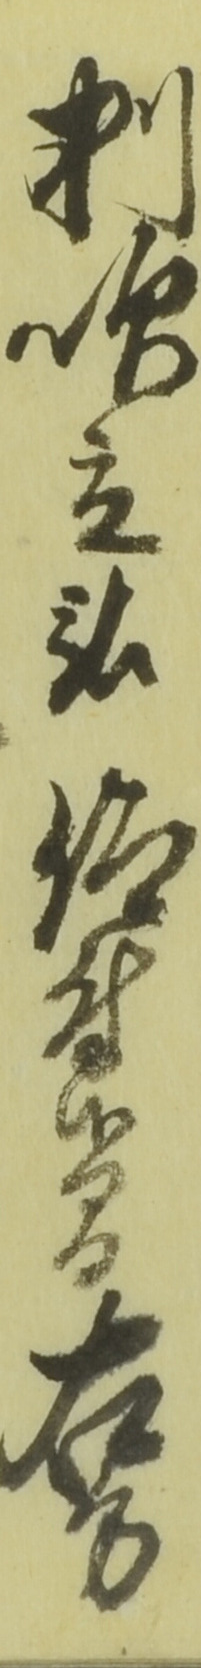判吹立被仰付候間右方
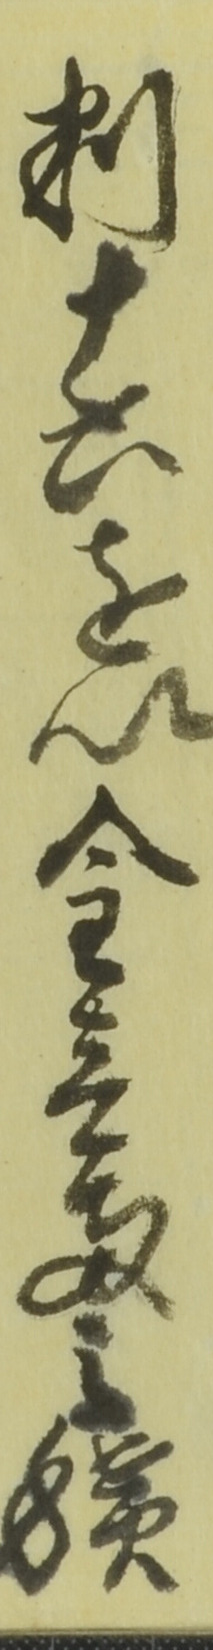判十六を以金壱両之積
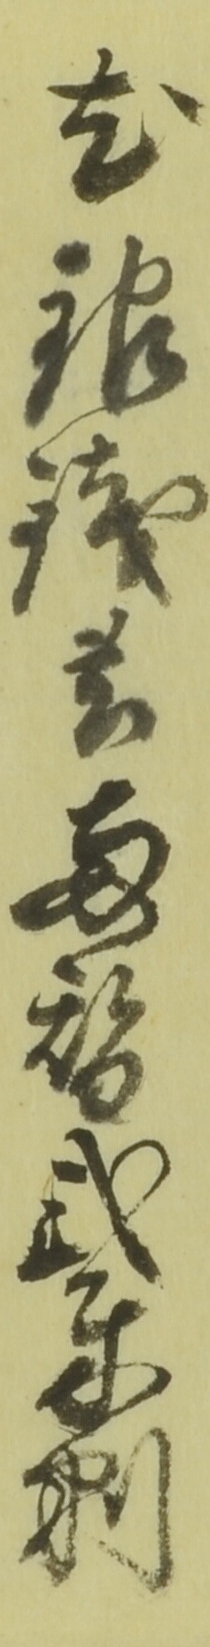尤銀銭共両替弐朱判
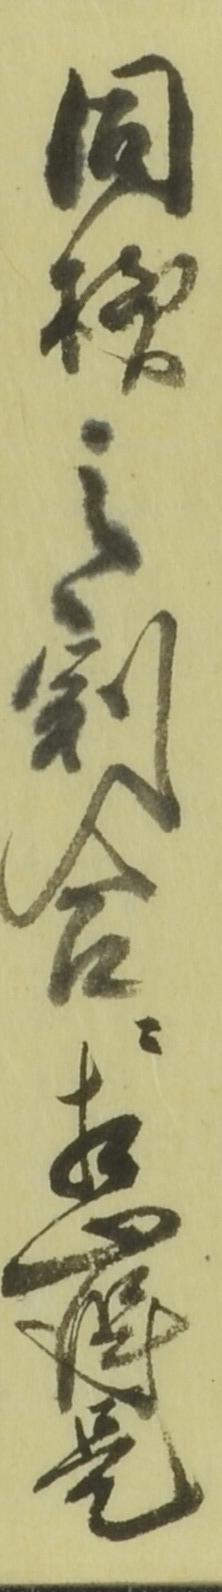同様之割合ニ相心得是
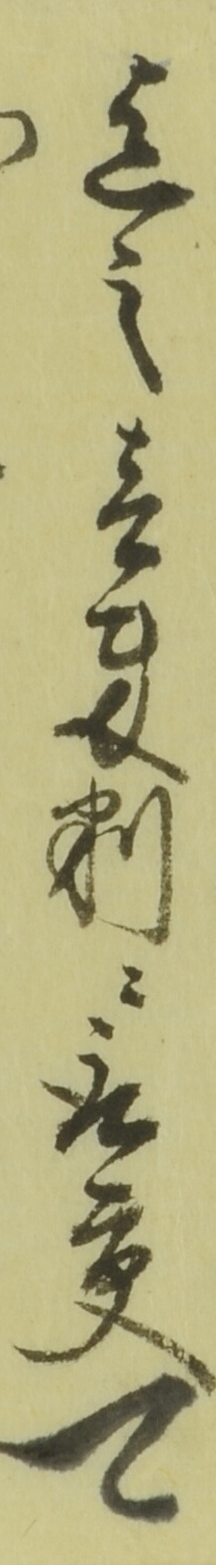迄之壱朱判ニ取交可
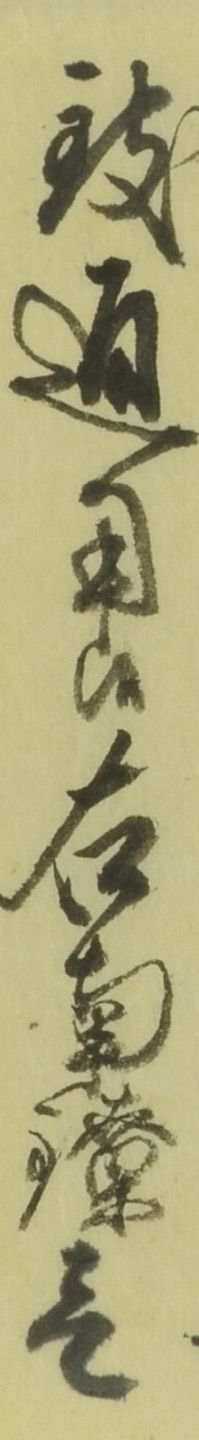致通用候右南鐐壱
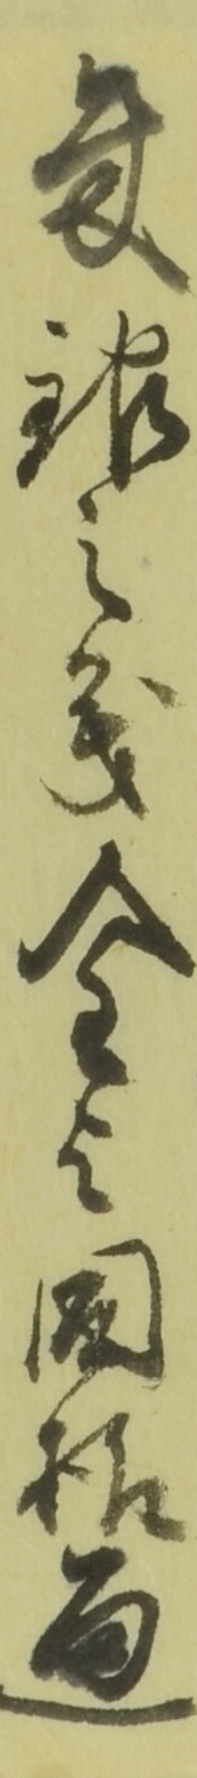朱銀之義金と同様通
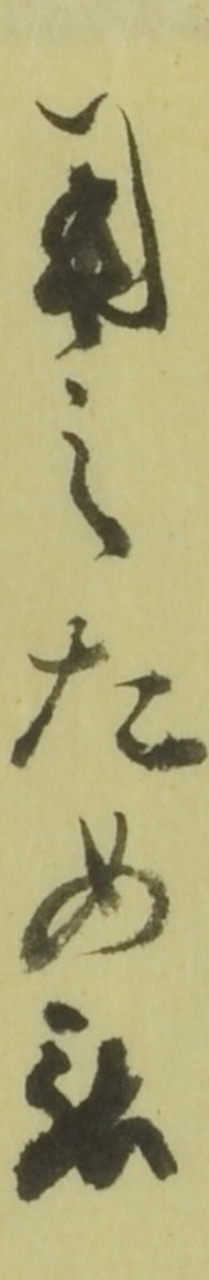用之ため被
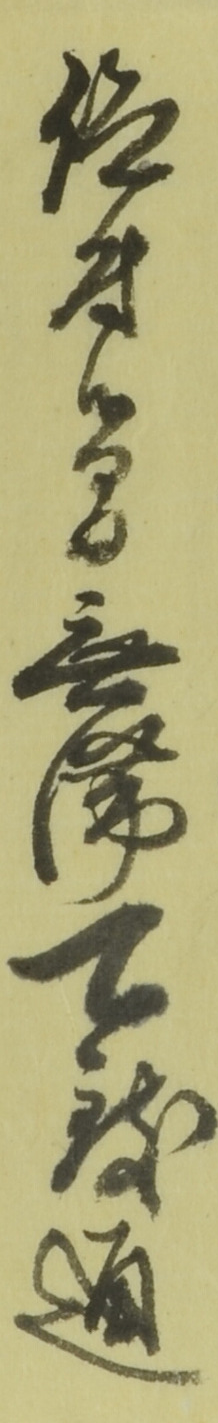仰付候間無滞可致通
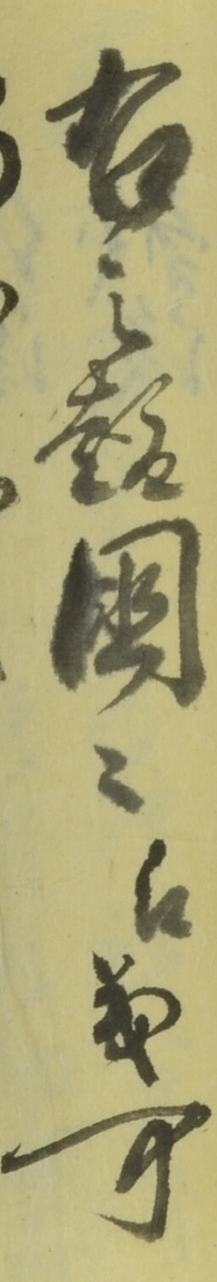右之趣国々江義可
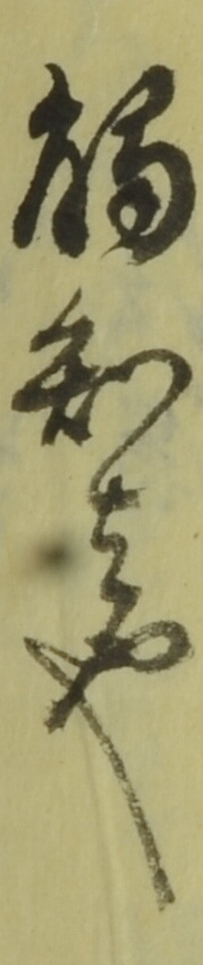触知者也

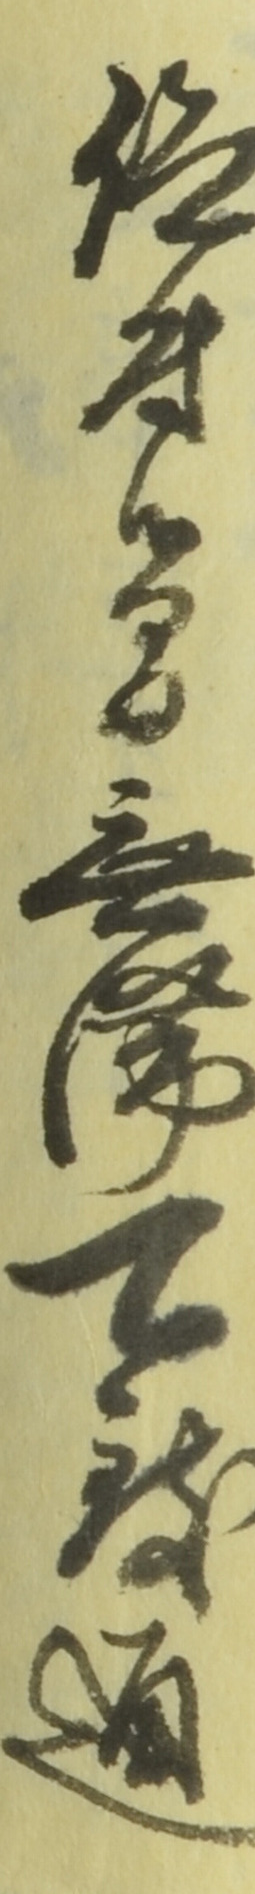仰付候間無滞可致通
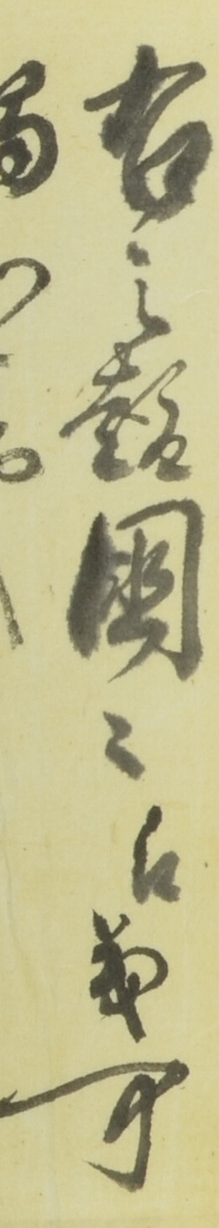右之趣国々江義可
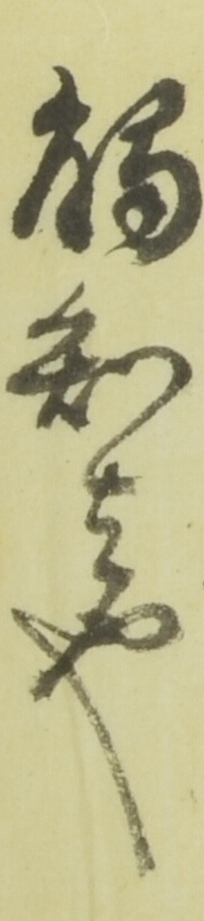触知者也
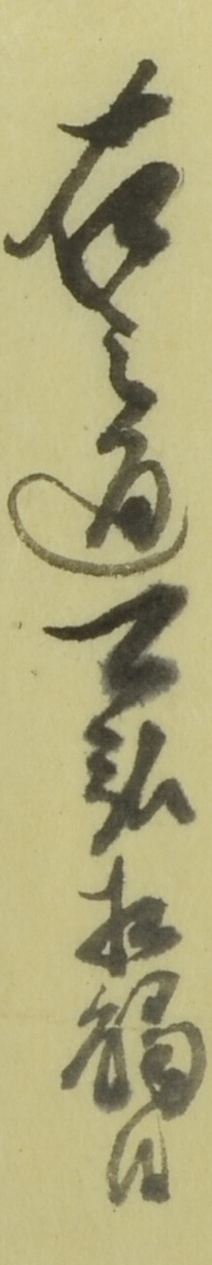右之通可被相触候
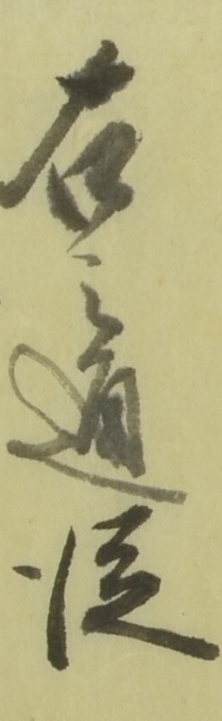右之通従
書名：御触書御書附控
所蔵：伊那市立高遠町図書館・合同会社AMANE
